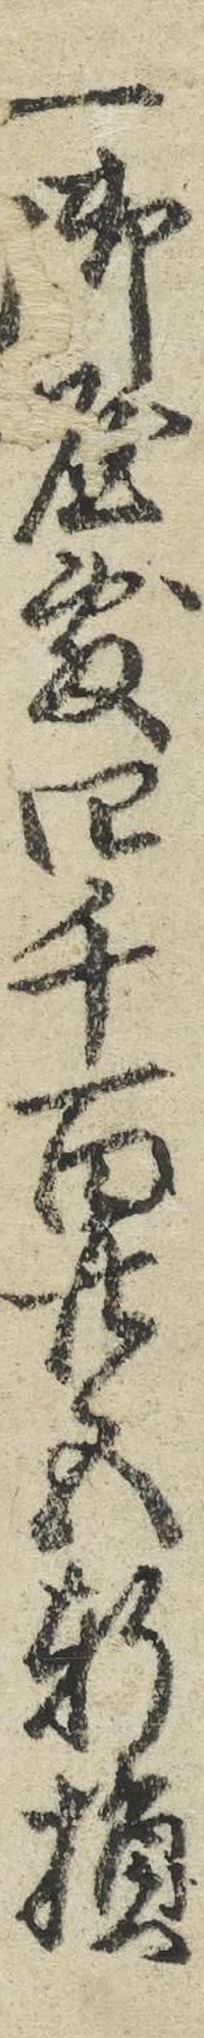一御屋敷四千百廿五軒損
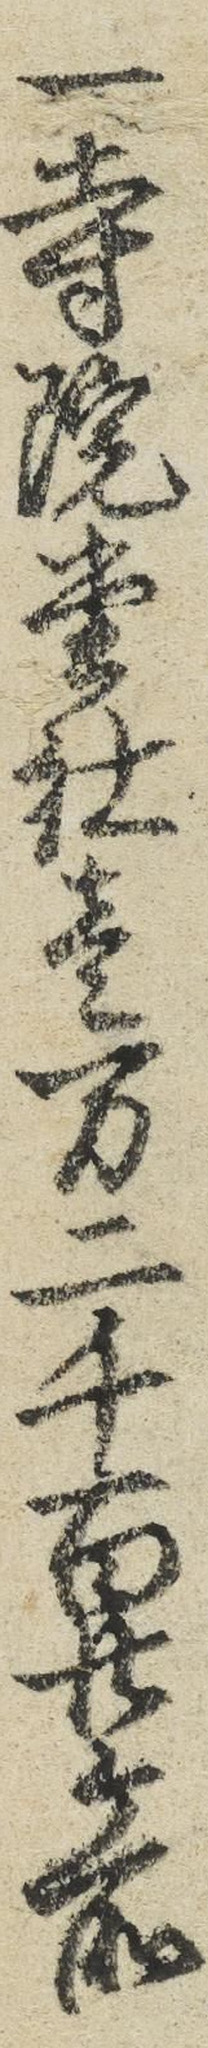一寺院堂社壱万二千百廿ヶ所
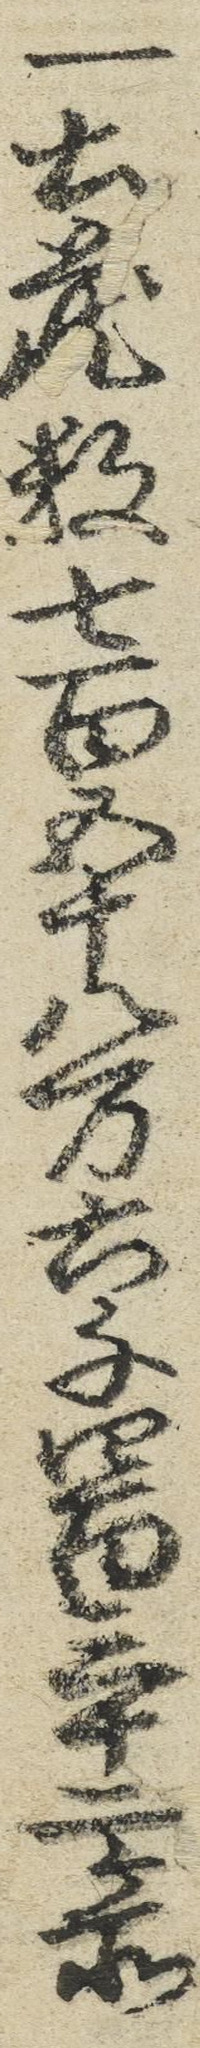一土蔵数七百五十八万六千四百三十二ヶ所
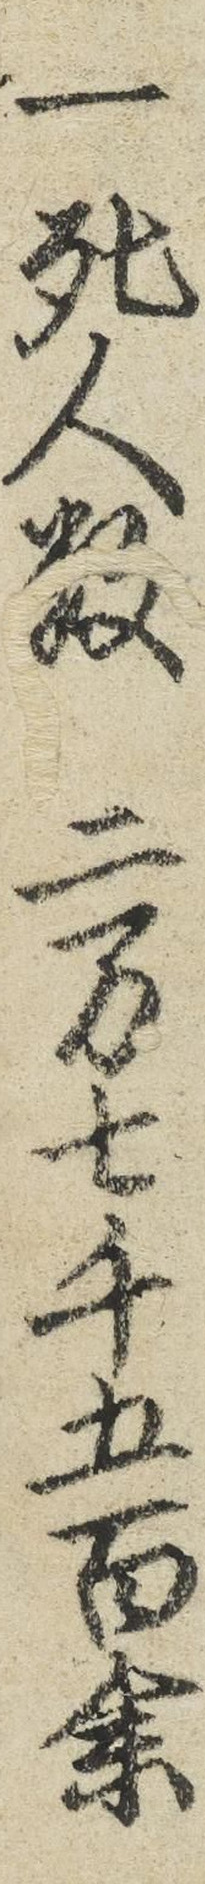一死人数二万七千五百余
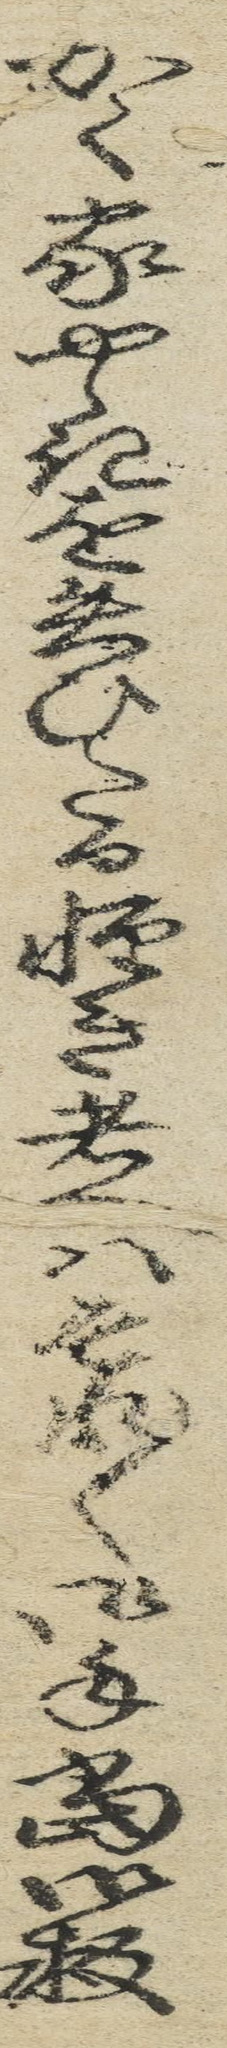かく家やしきを失ひたる軽き者へハそれ〳〵御手当御救
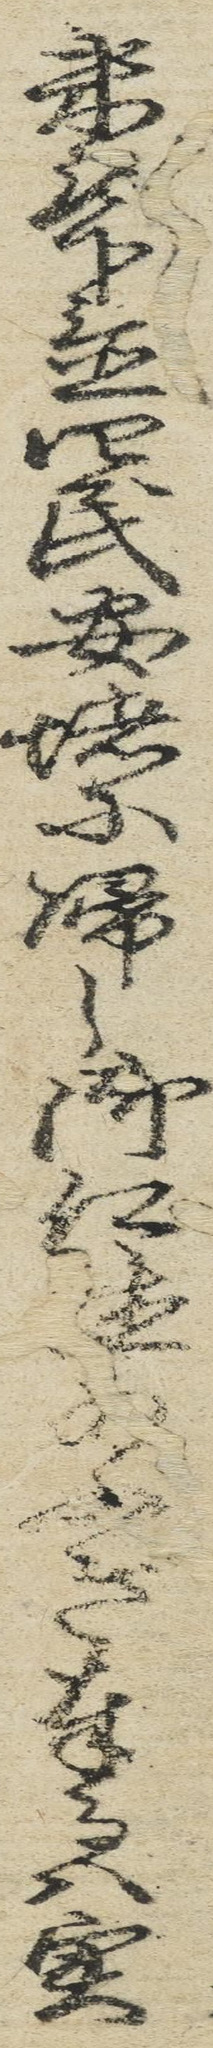米被下置四民安堵に帰し御仁徳あふぎ奉るは実
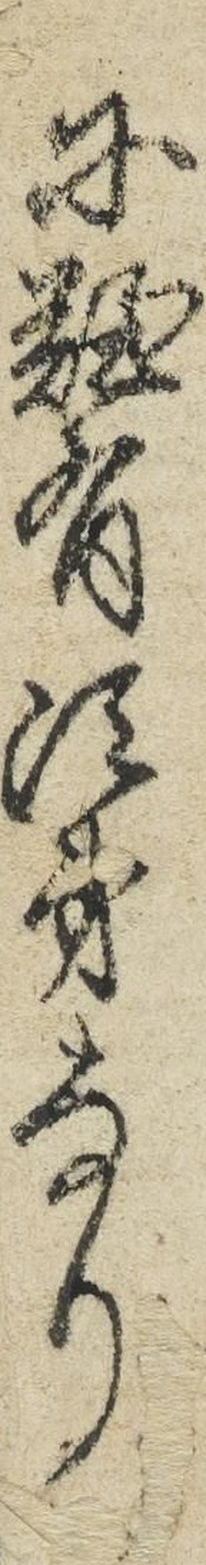に難有次第なり
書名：関東五街道　江戸大地震出火場所
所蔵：東京大学地震研究所図書室 Earthquake Research Institute Library, The University of Tokyo, JAPAN
